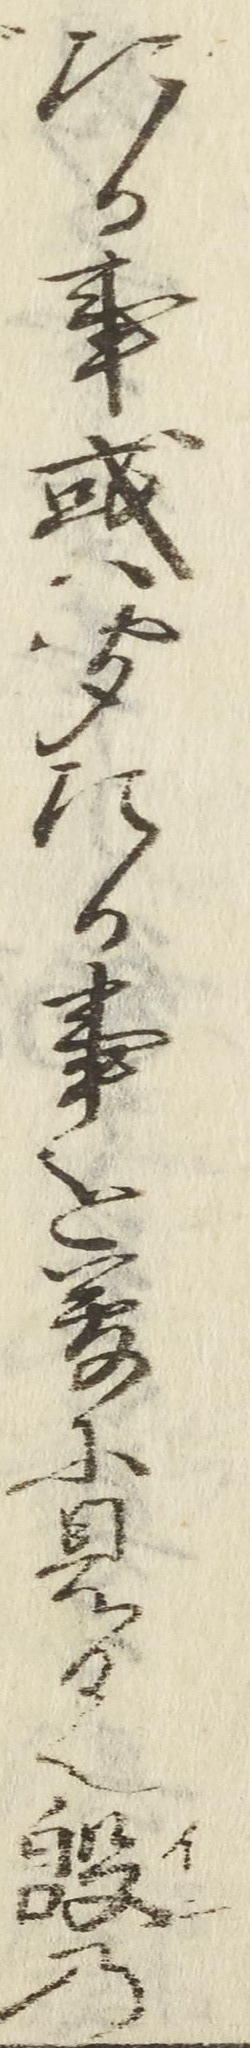たる事或は聞たる事を夢に見る也殷の
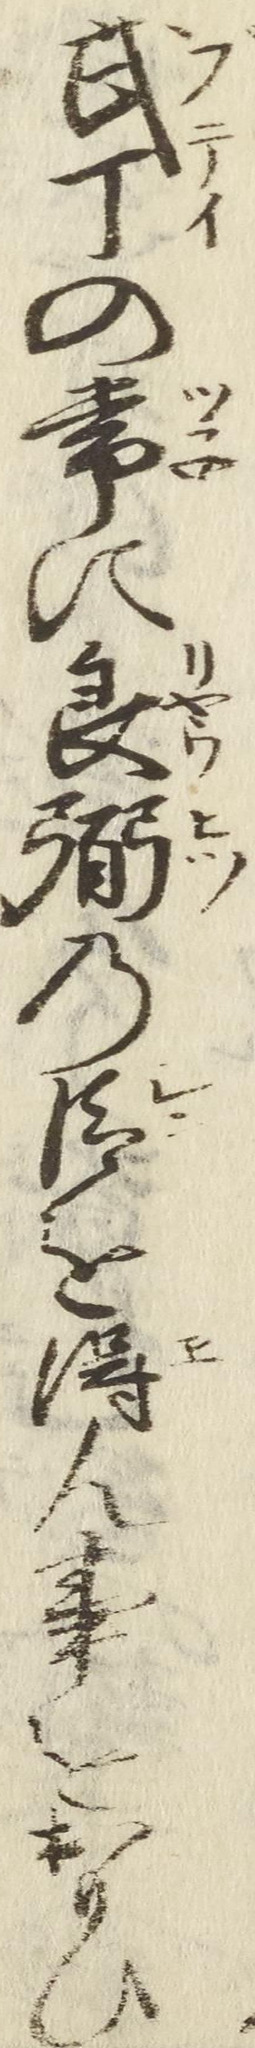武丁の常に良弼の臣を得ん事をおもひ
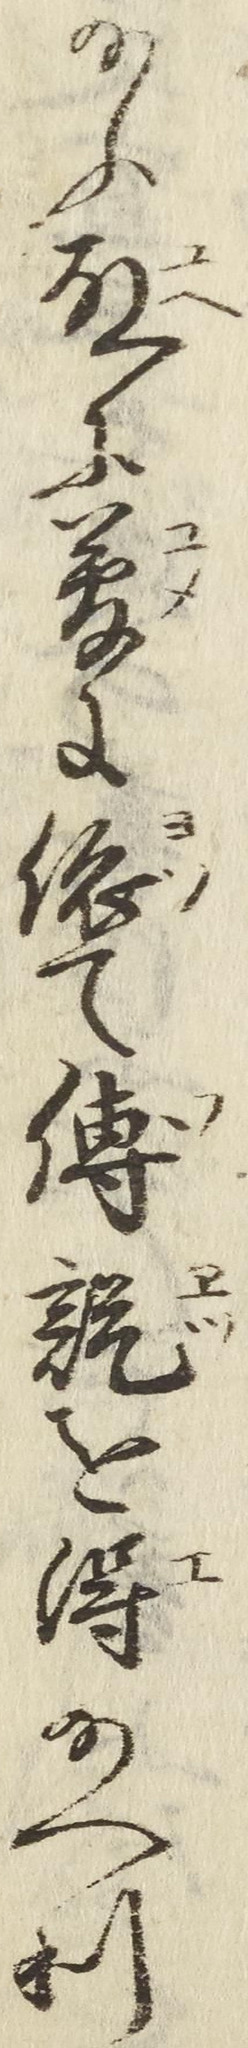給ふ故に夢に依て傅説を得給へり

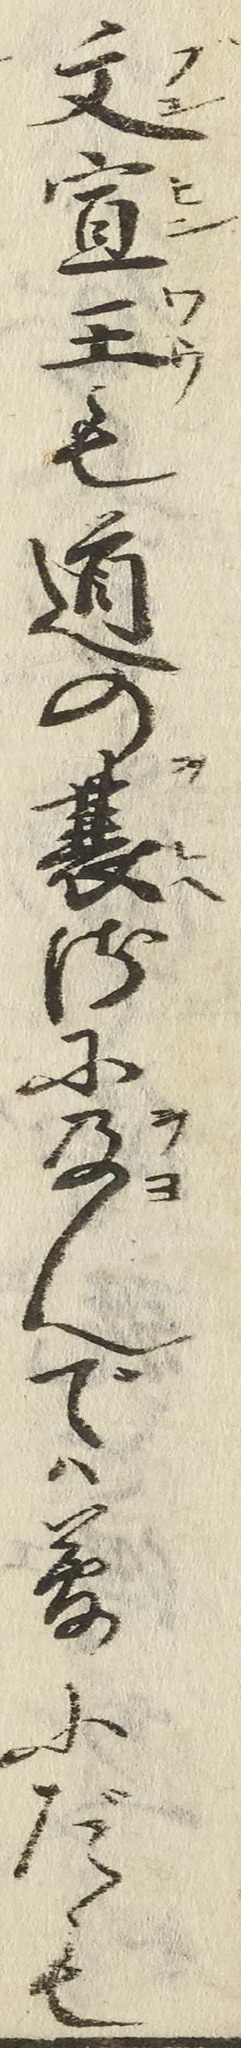文宣王も道の衰るに及んでは夢にだも
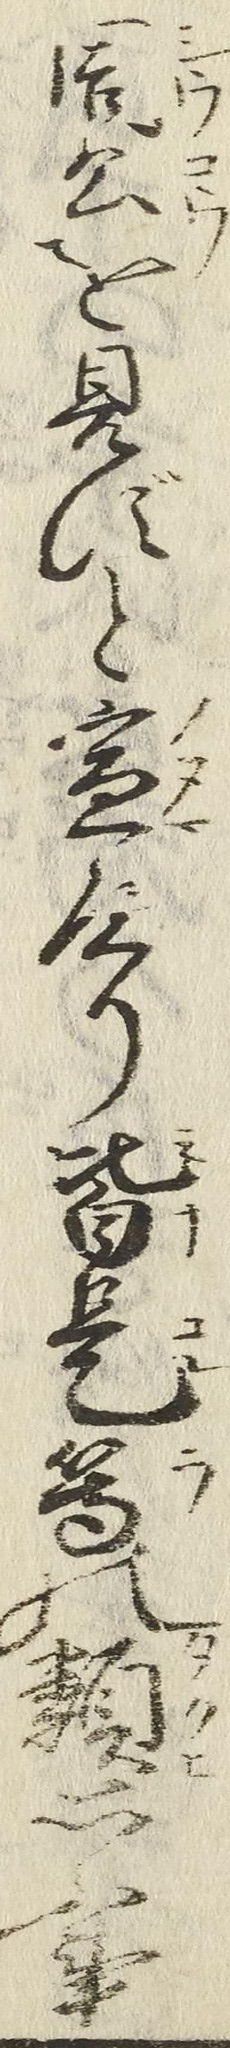周公を見ずと宣へり皆是等の類思ふ事
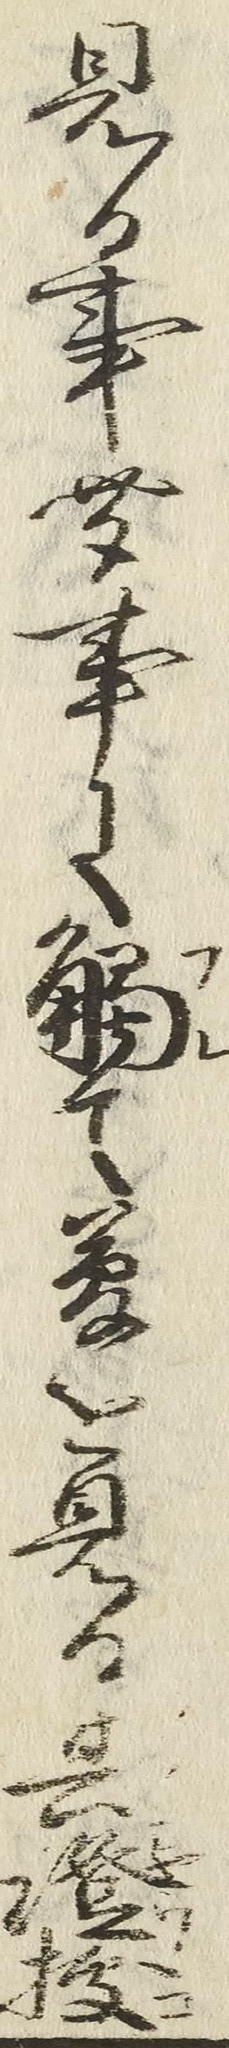見る事聞事に触て夢を見る其証拠
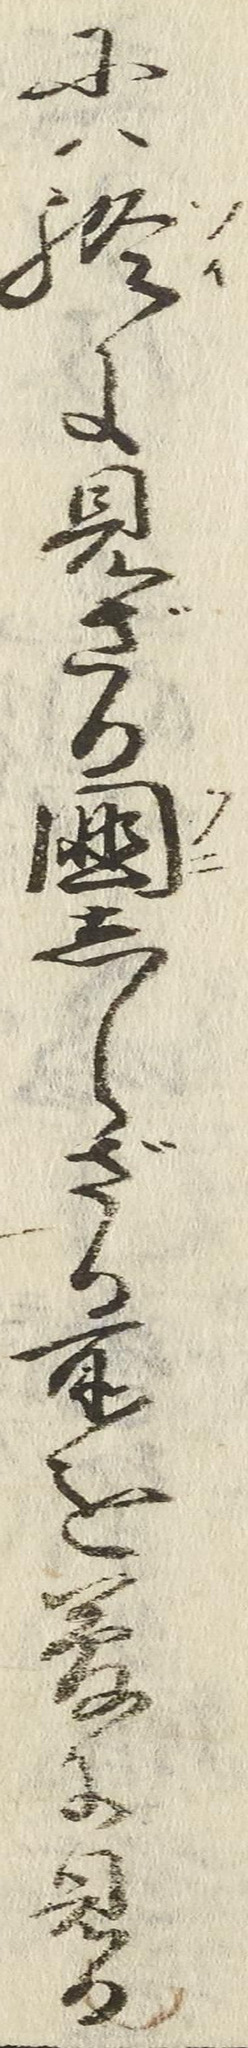には終に見ざる国しらざる所を夢に見る
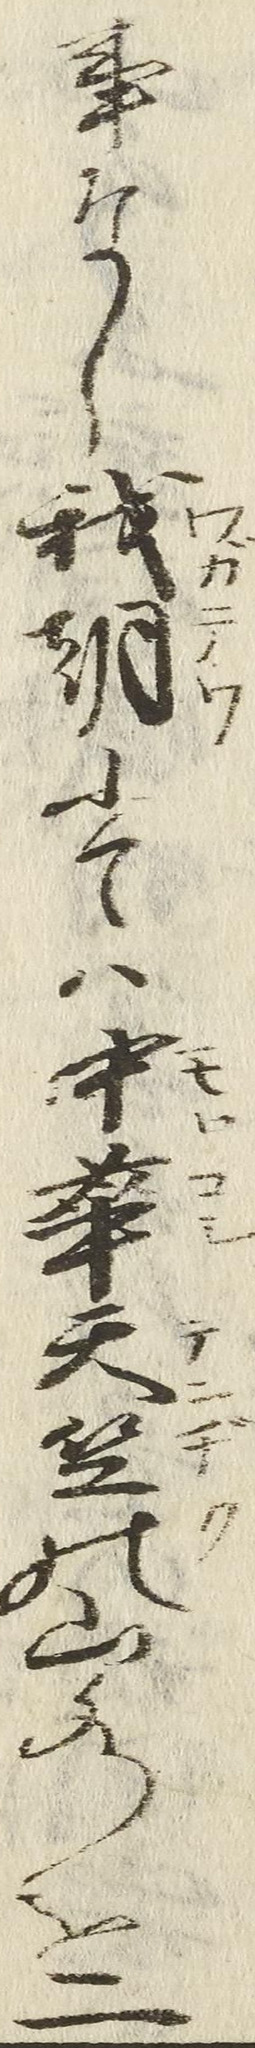事なし我朝にては中華天竺の山水を二
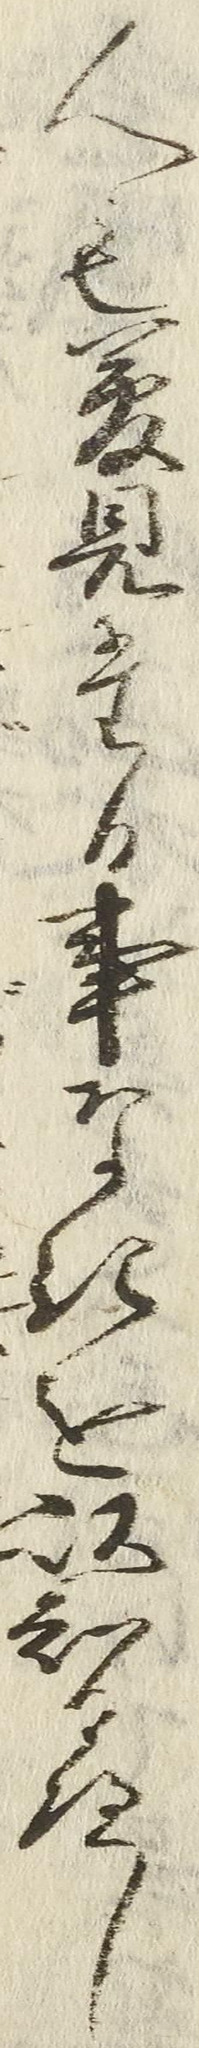人も夢見たる事なきを以知るへし
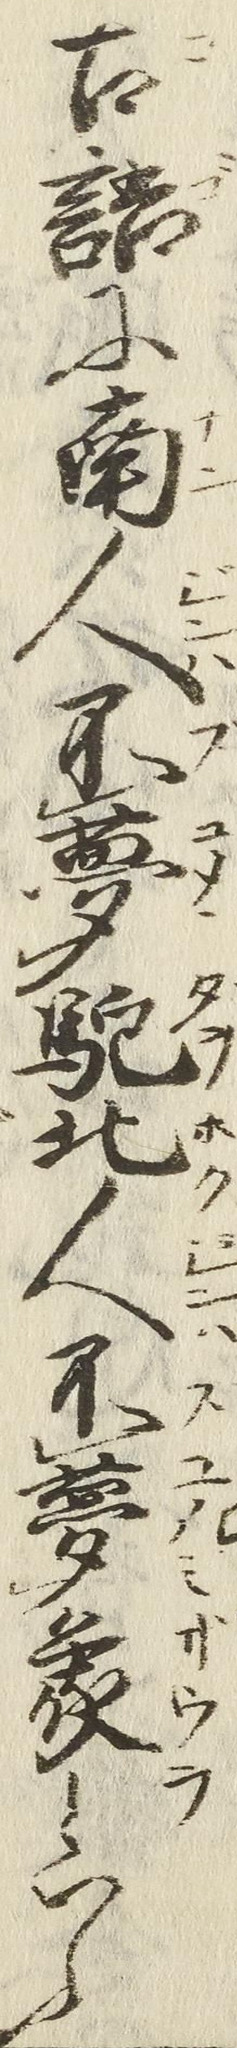古語に南人不夢駝北人不夢象といふ
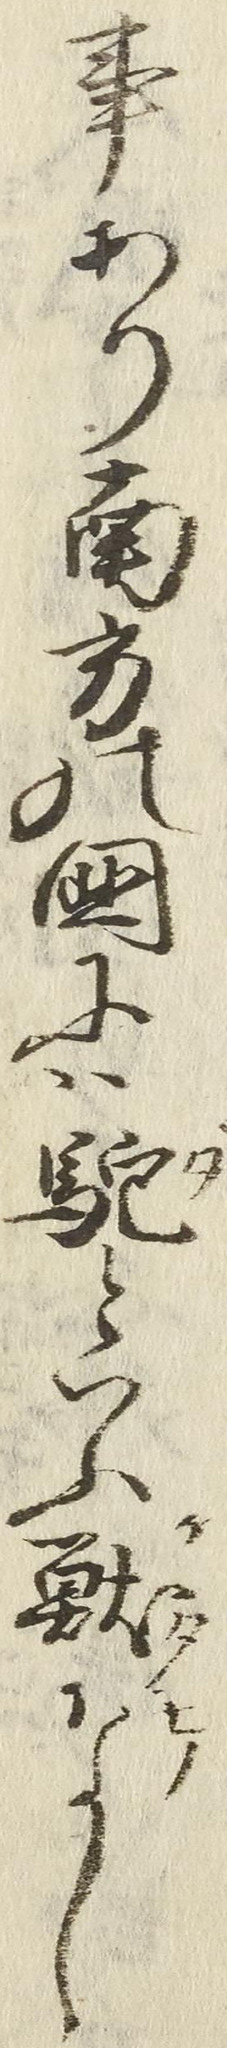事あり南方の国には駝といふ獣なし
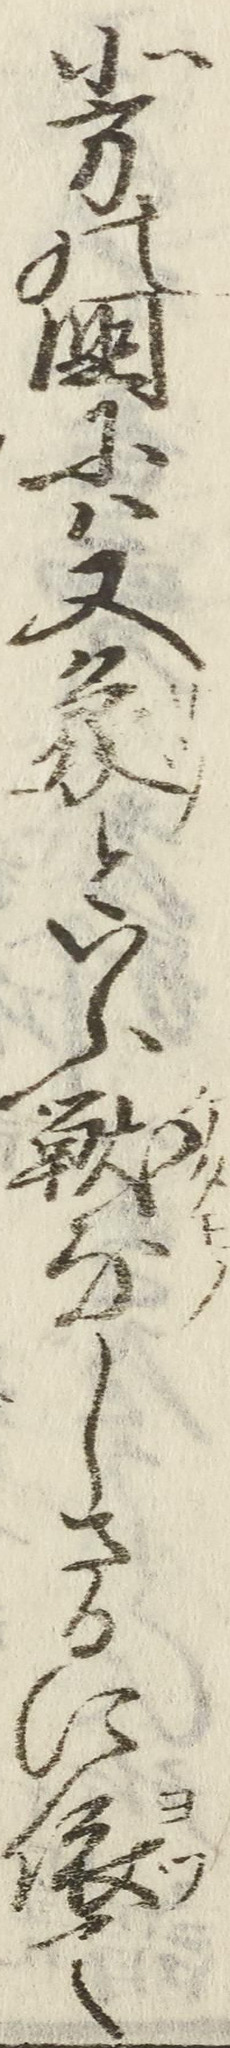北方の国には又象といふ獣なしさるに依て
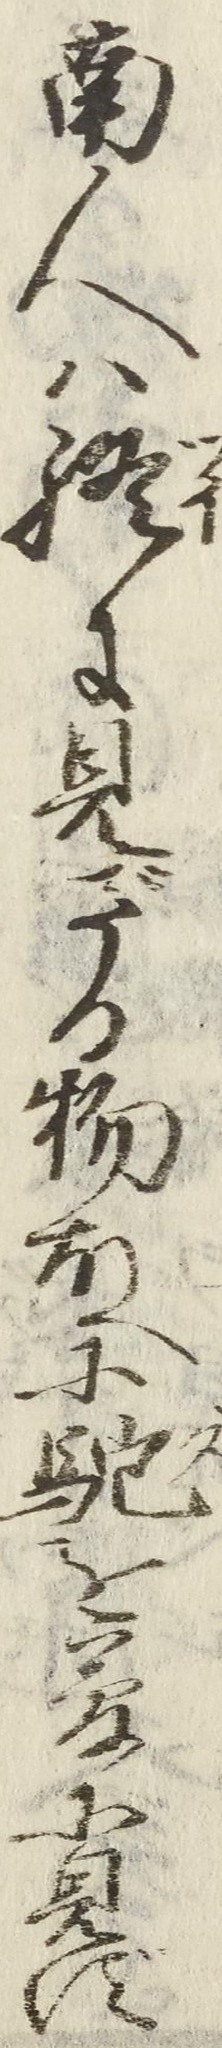南人は終に見ざる物故へに駝を夢に見ず
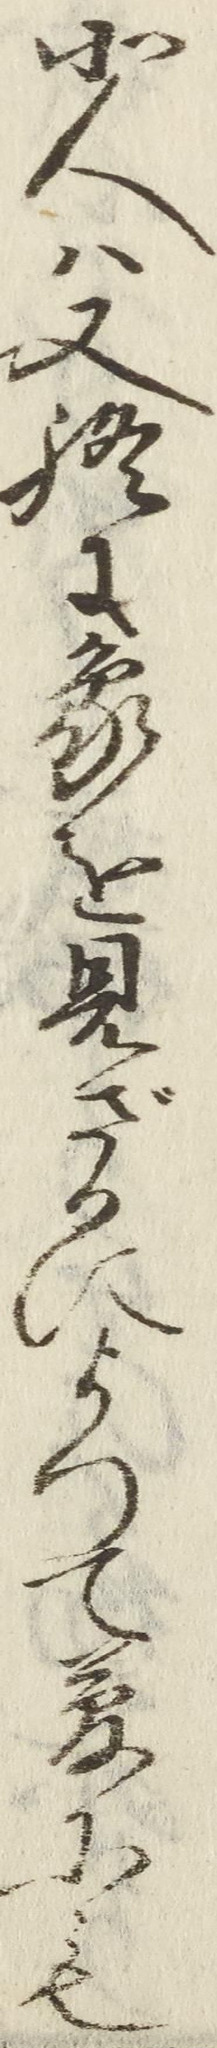北人は又終に象を見ざるによつて夢にも
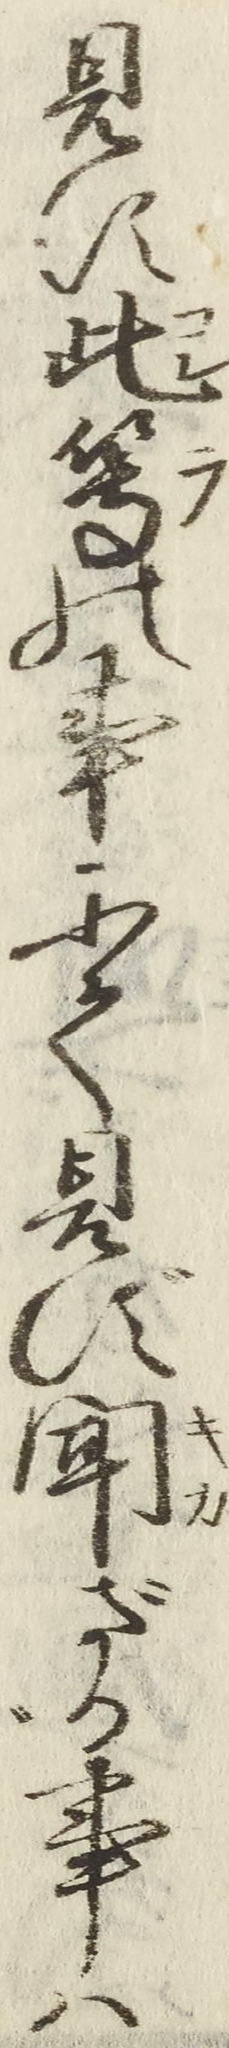見す是等の事にて見ず聞ざる事は
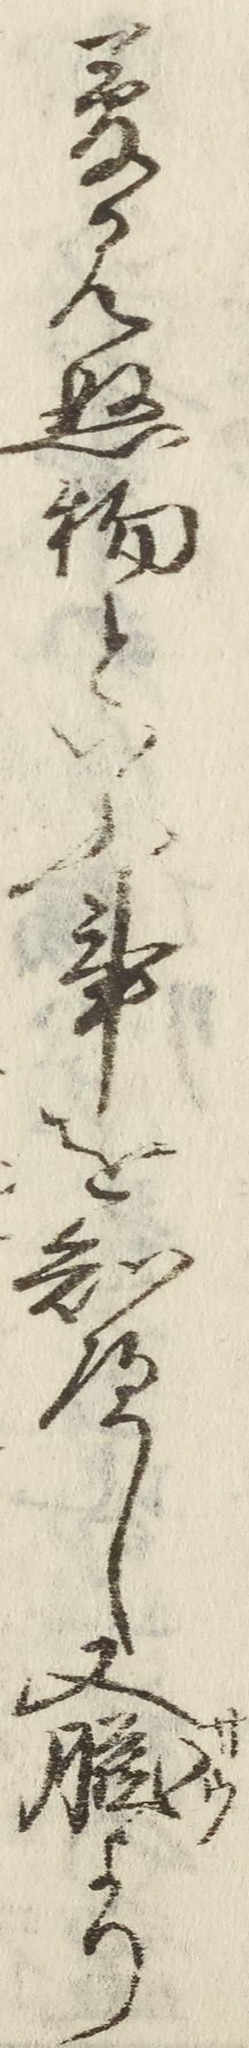夢見ぬ物といふ事を知へし又臓より
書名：天地或問珍　地
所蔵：東京大学地震研究所図書室 Earthquake Research Institute Library, The University of Tokyo, JAPAN
